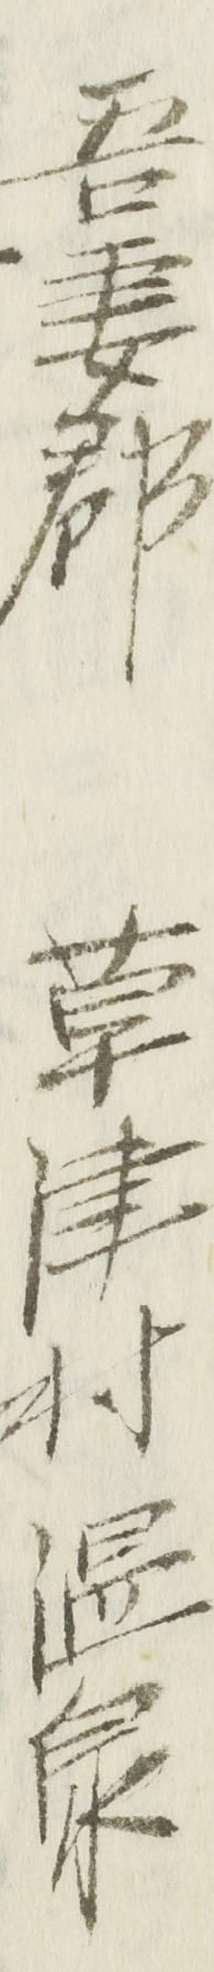吾妻郡草津村温泉
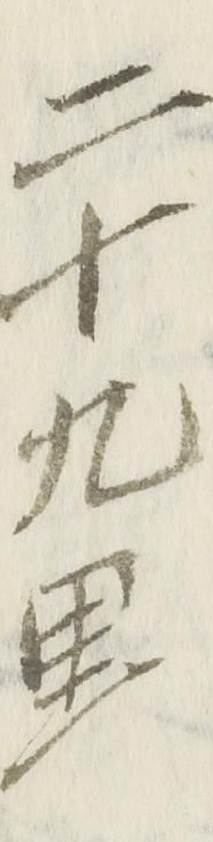二十九里
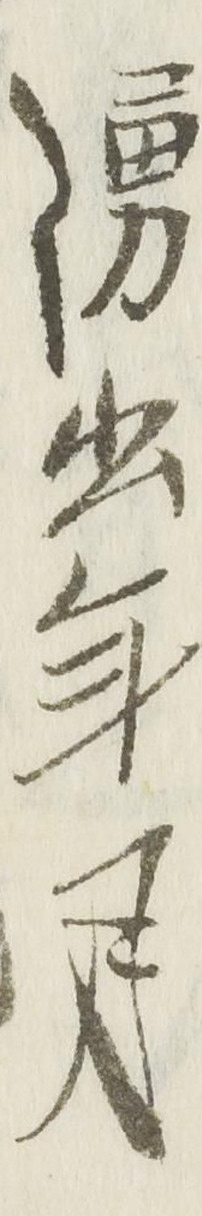湧出年月
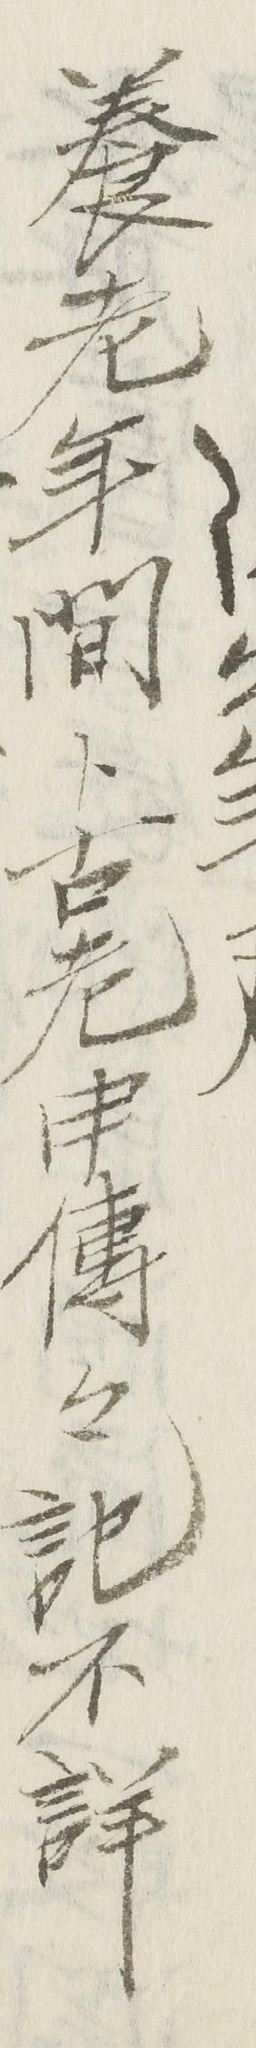養老年間ト古老申傳々記不詳
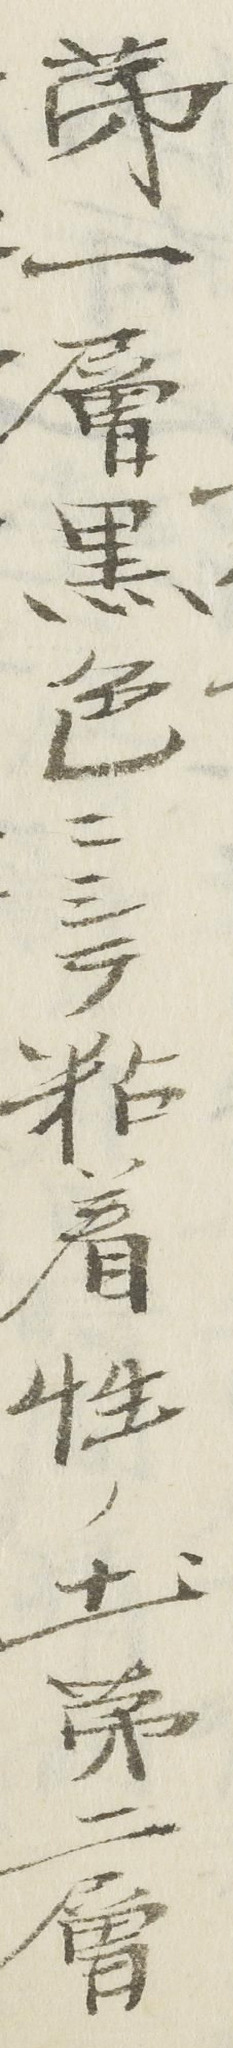第一層黒色ニシテ粘着性ノ土第二層
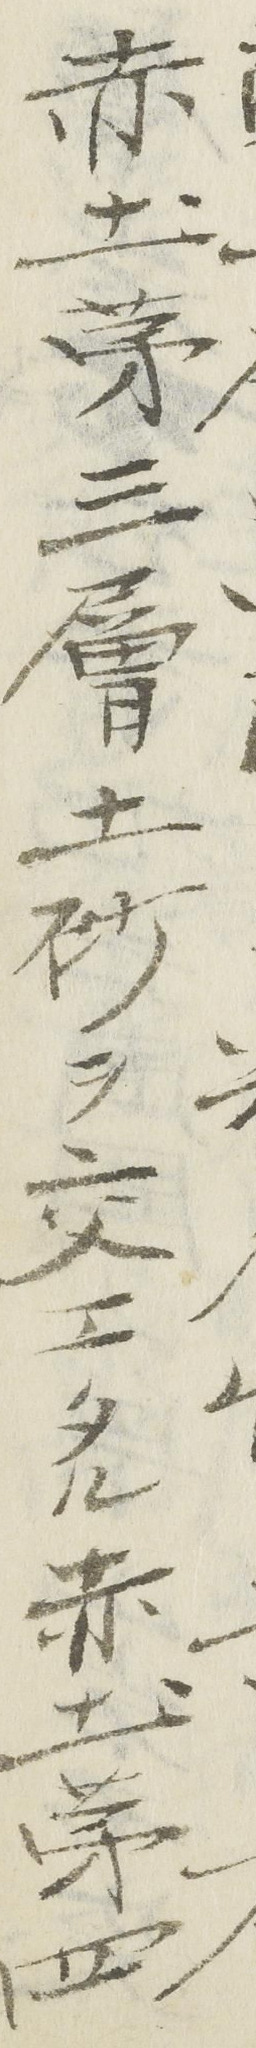赤土第三層土砂ヲ交エタル赤土第四

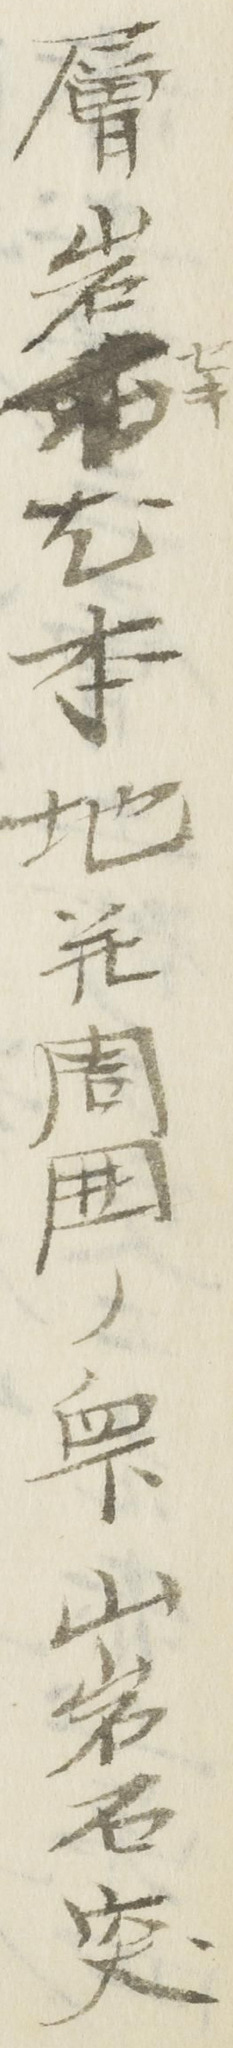層岩石尤本地并周囲の衆？山岩石突
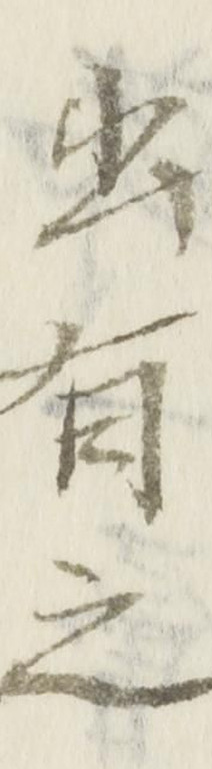出有之
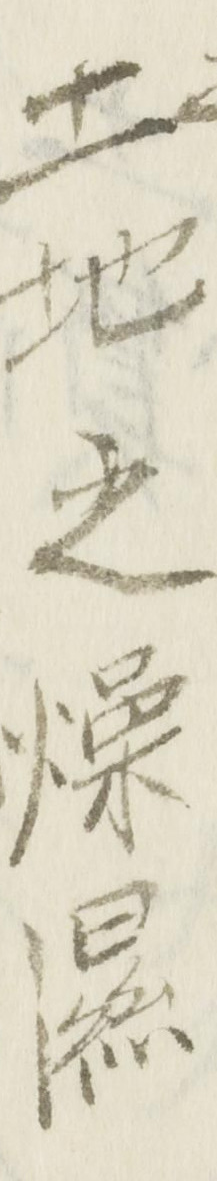土地之燥濕
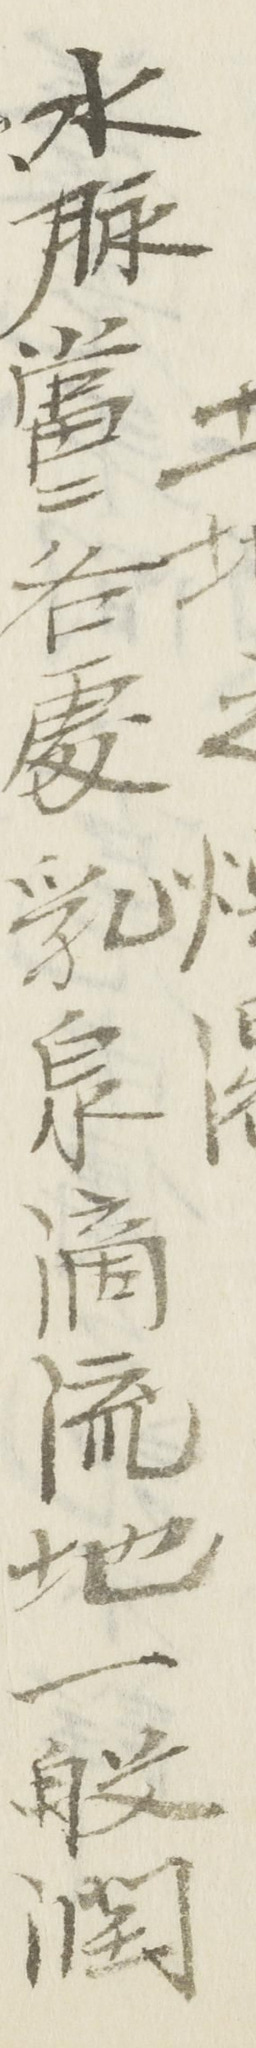水脈当に各處乳泉滴流地一般潤
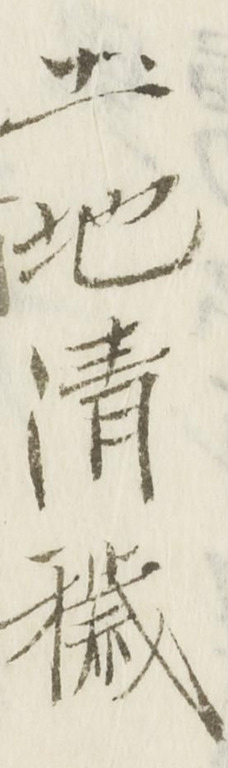土地清穢
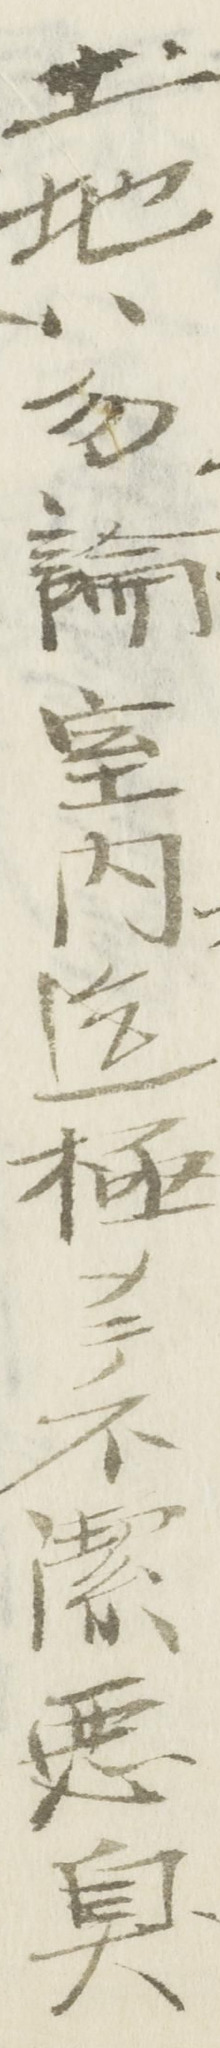土地は勿論室内迄極めて不潔悪臭
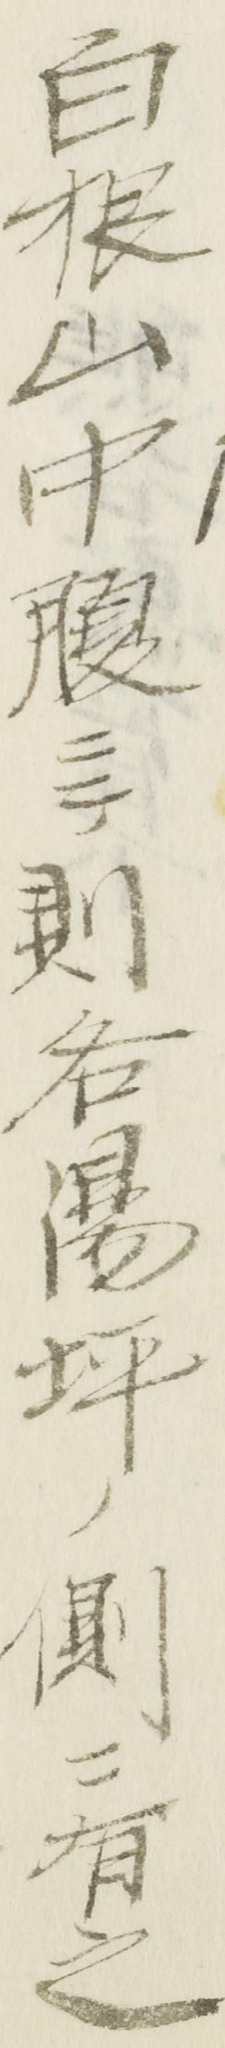白根山中腹にて則各湯坪の側に有之
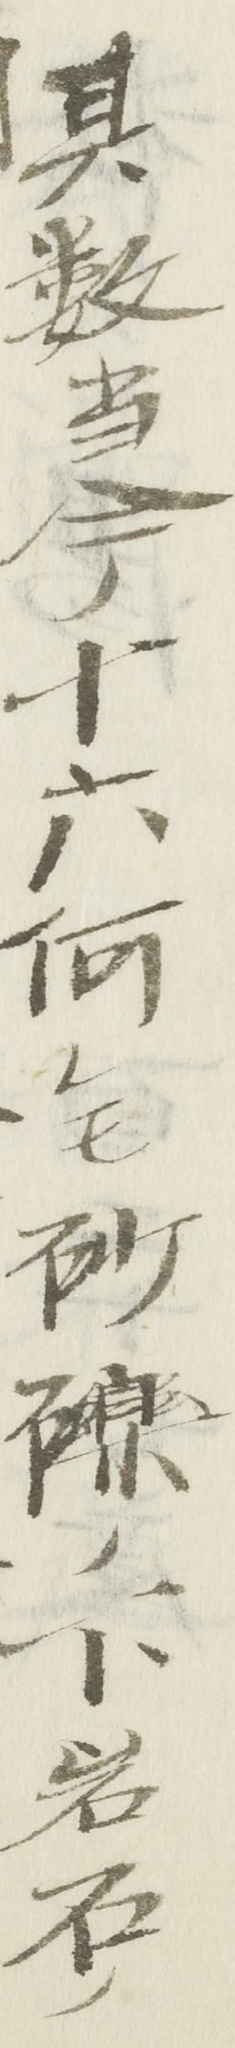其数当今十六何れも砂礫の下岩石の
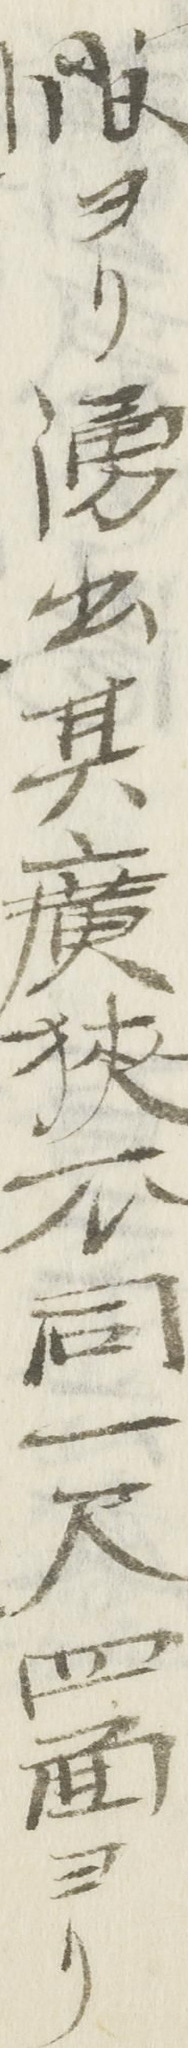間より湧出其廣狭不同一尺四面より
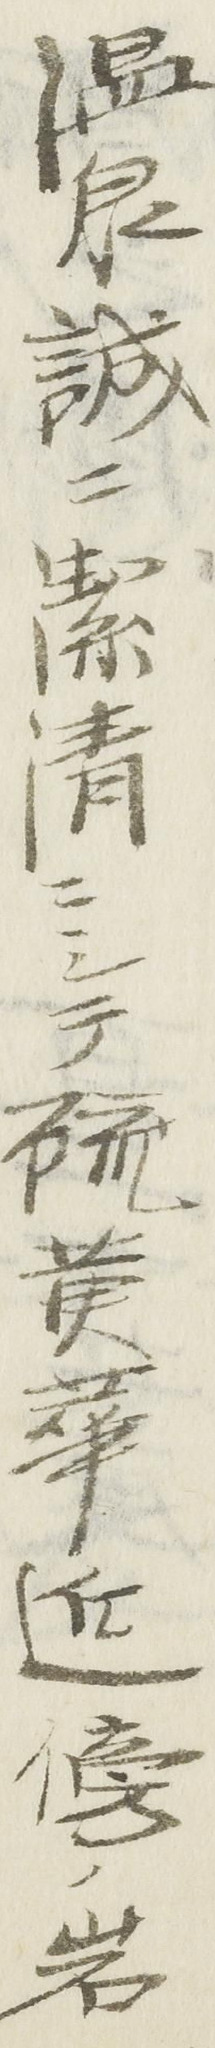温泉誠ニ清潔ニシテ硫黄翠近傍ノ岩
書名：温冷泉試験表
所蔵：東京大学地震研究所図書室 Earthquake Research Institute Library, The University of Tokyo, JAPAN
